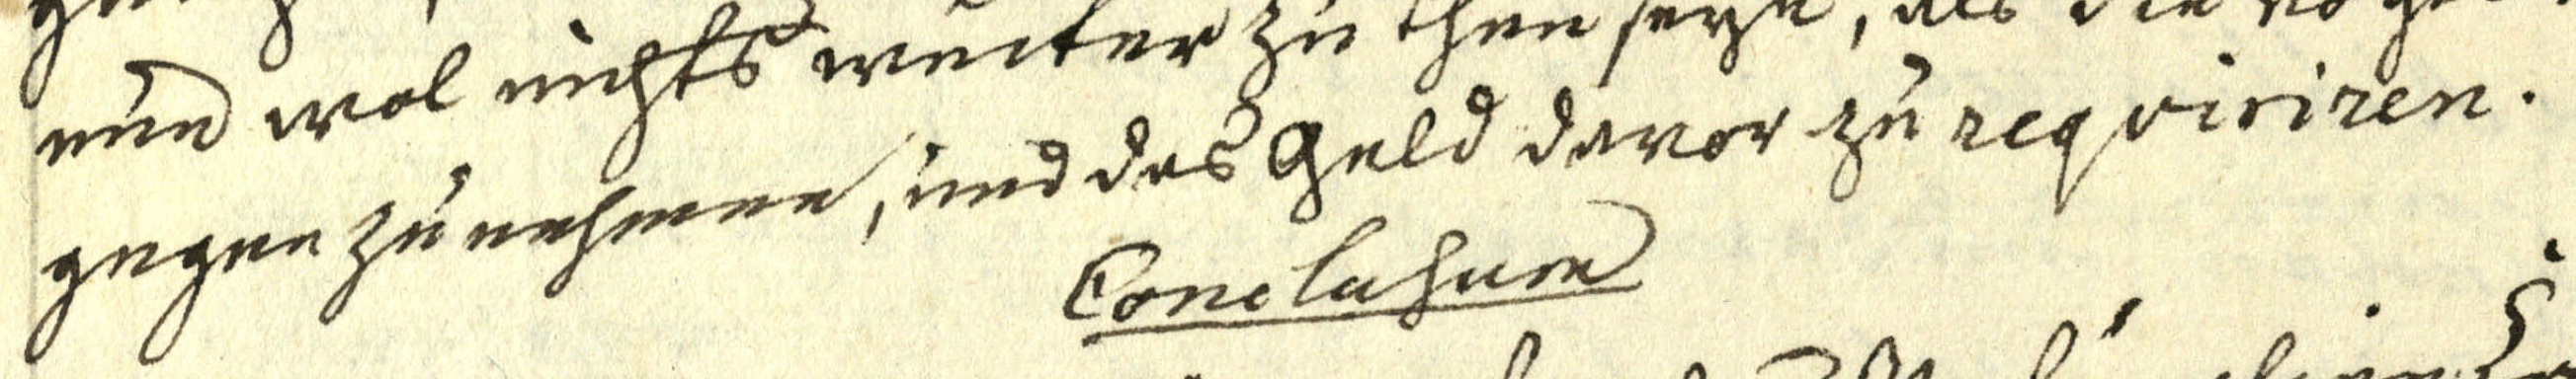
gegen zu nehmen, und das Geld davor zu requiriren.
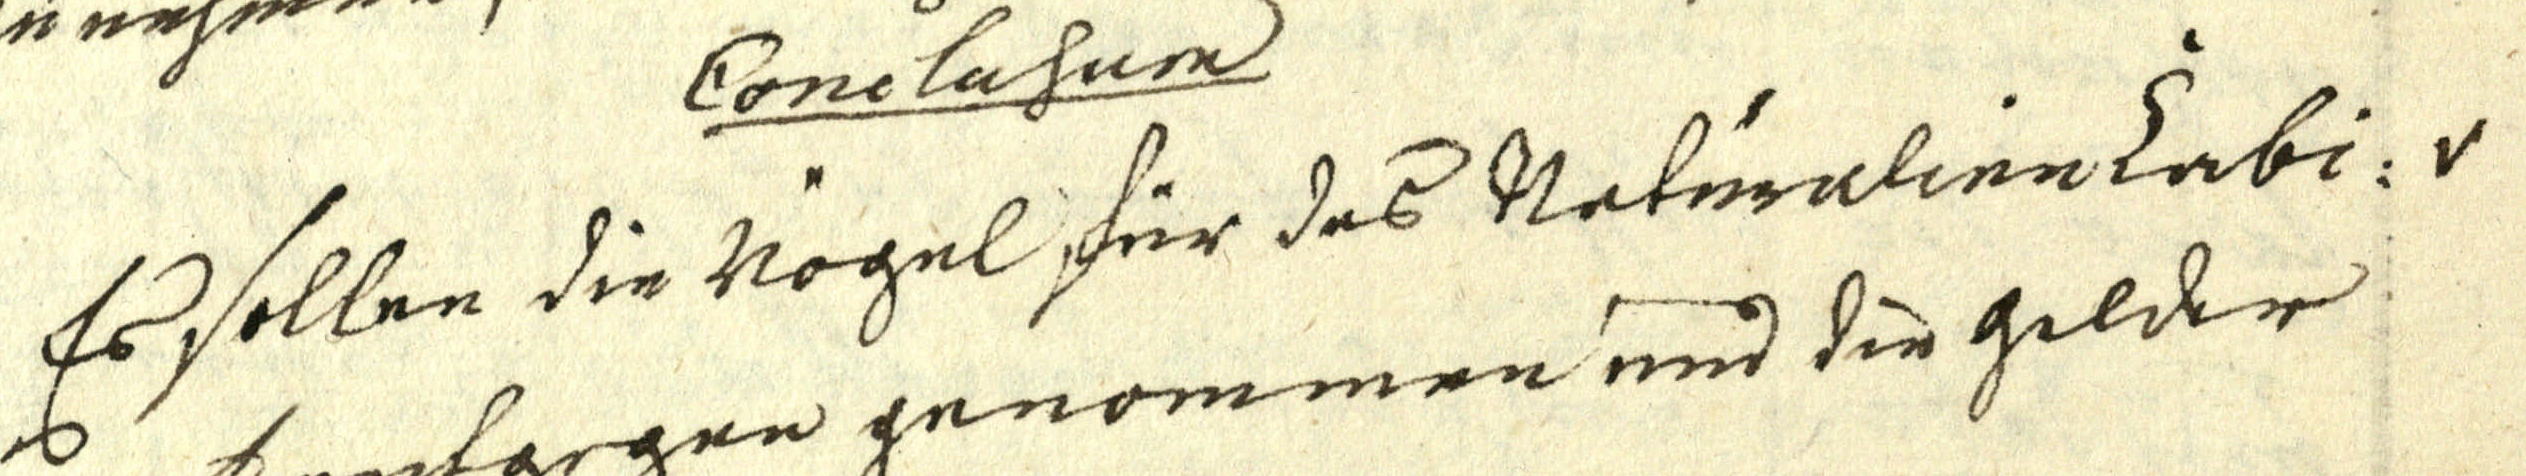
Es sollen die Vögel für das Naturalien Cabi¬
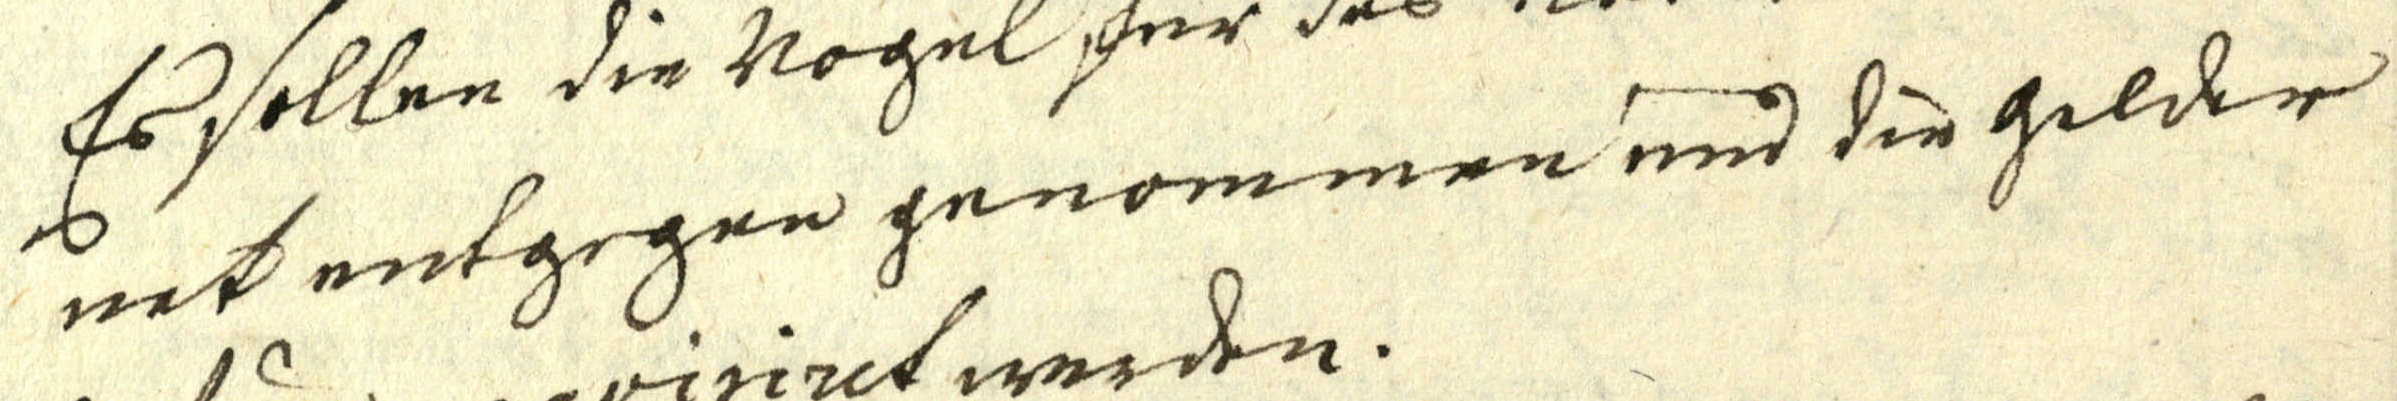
net entgegen genommen und die Gelder
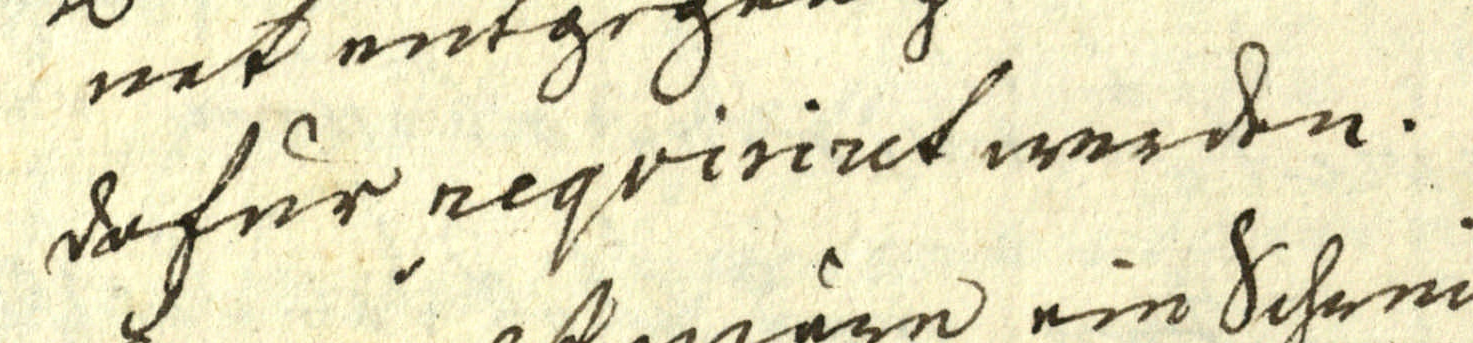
dafür requiriret werden.
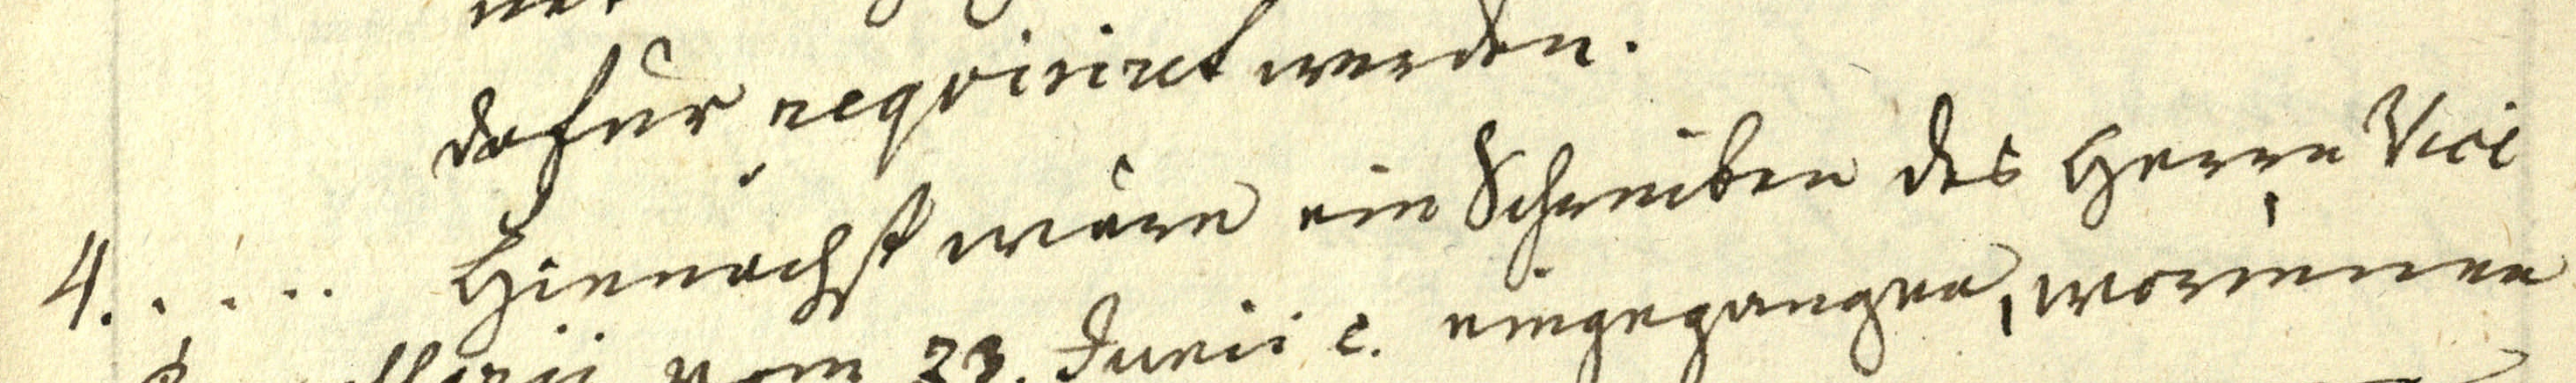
4. Hienächst wäre ein Schreiben des Herrn Vice
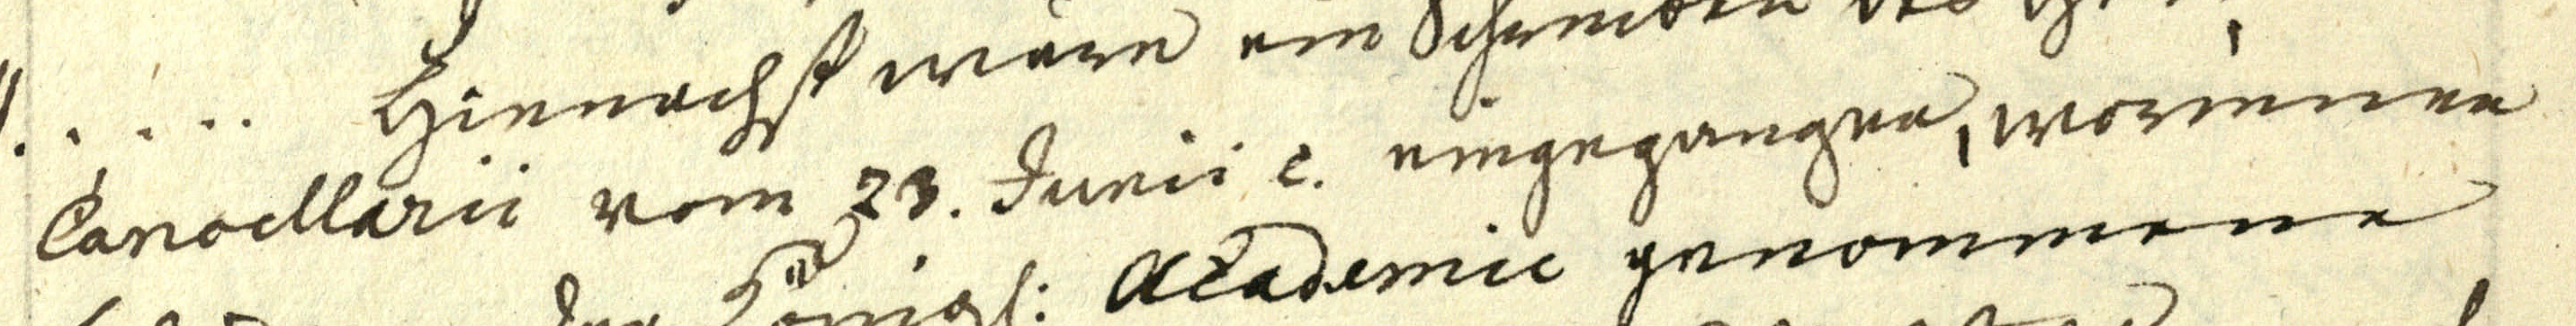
Cancellarius von 23. Junii c. eingegangen, worinnen
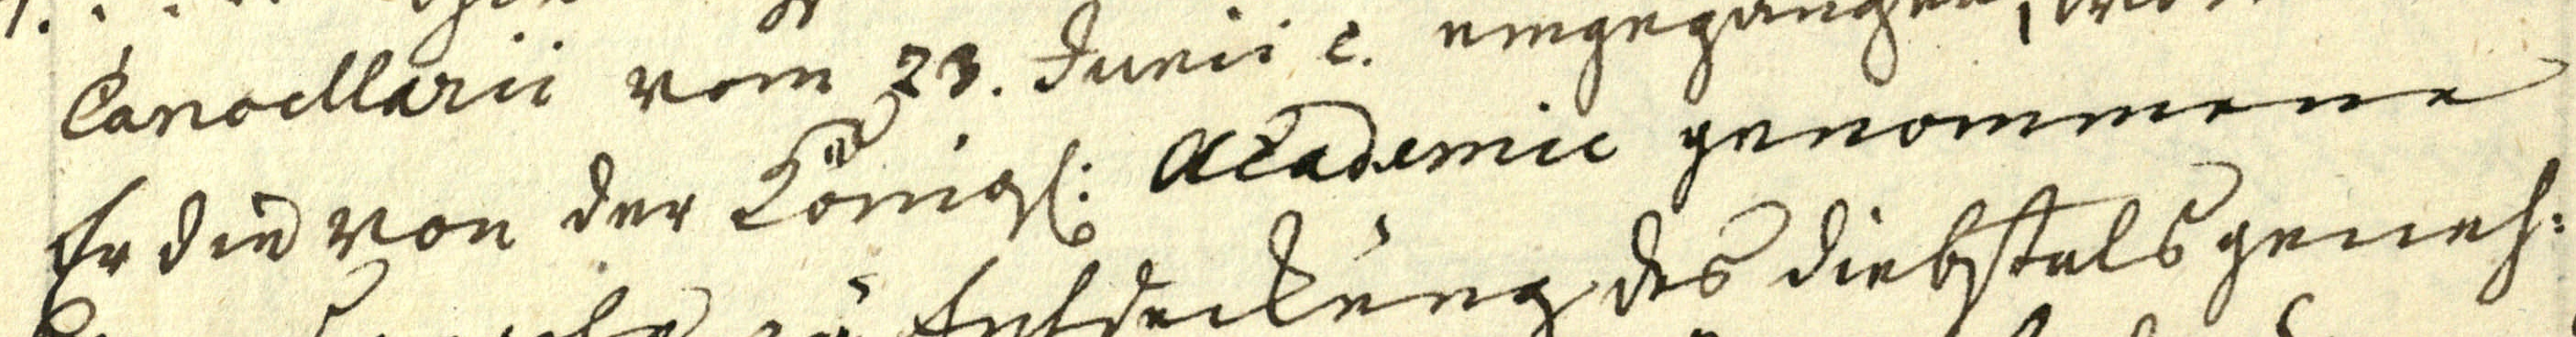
Er die von der Königl. Academie genommene
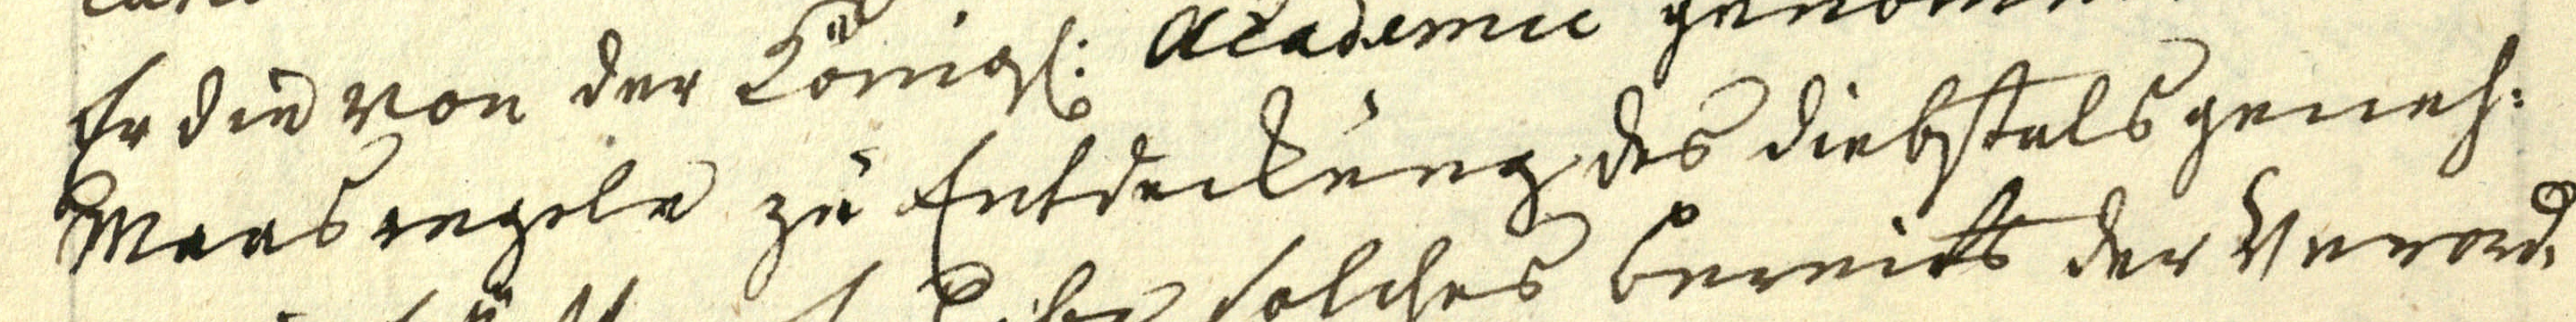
Maasregeln zu Entdeckung des Diebstals geneh¬
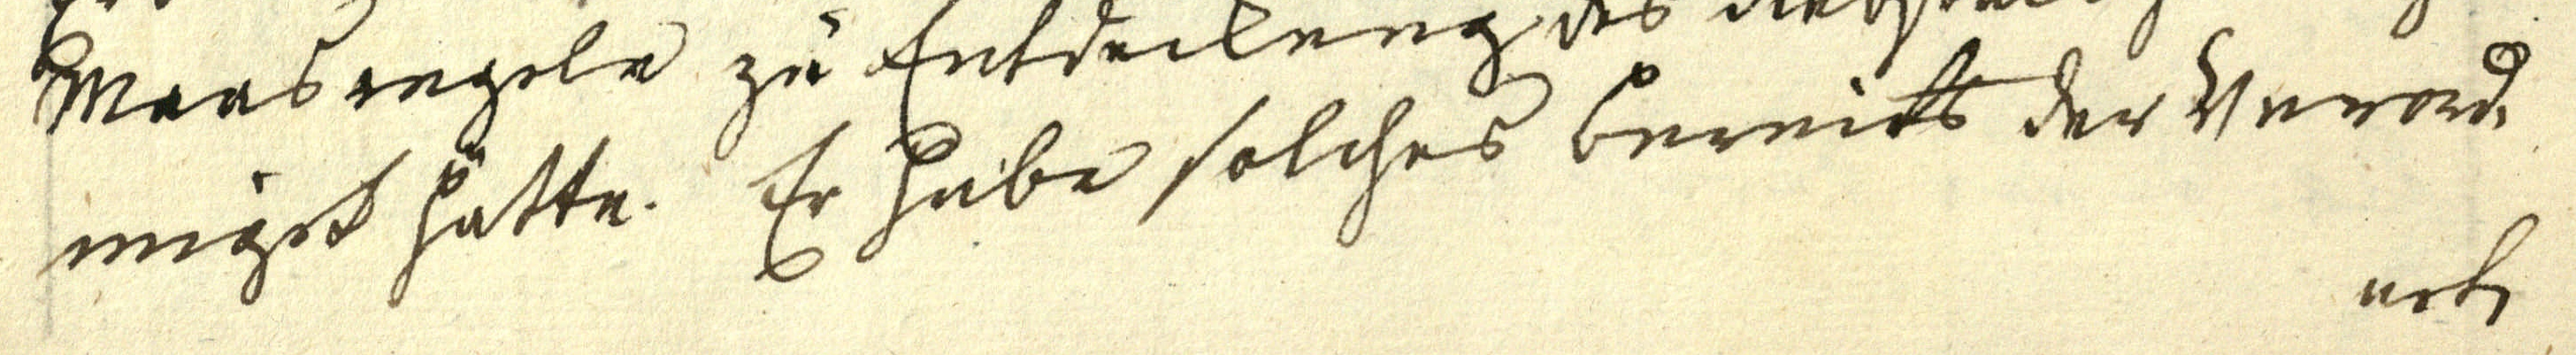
miget hätte. Er habe solches bereits der Verord¬
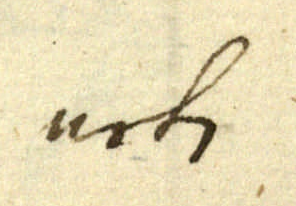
net
